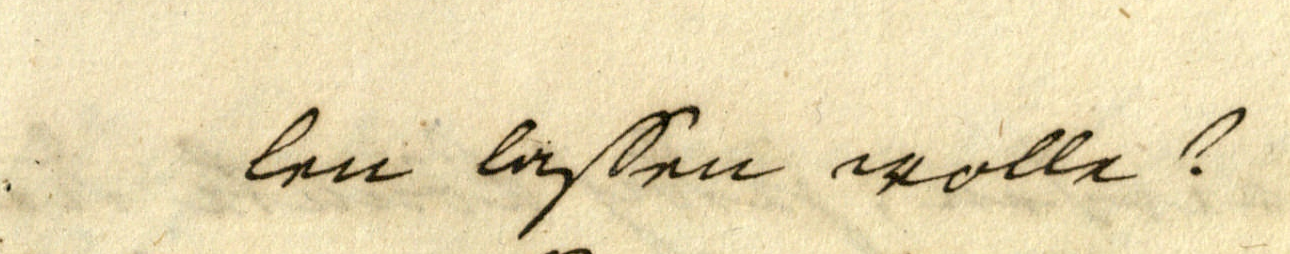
len lassen wolle?
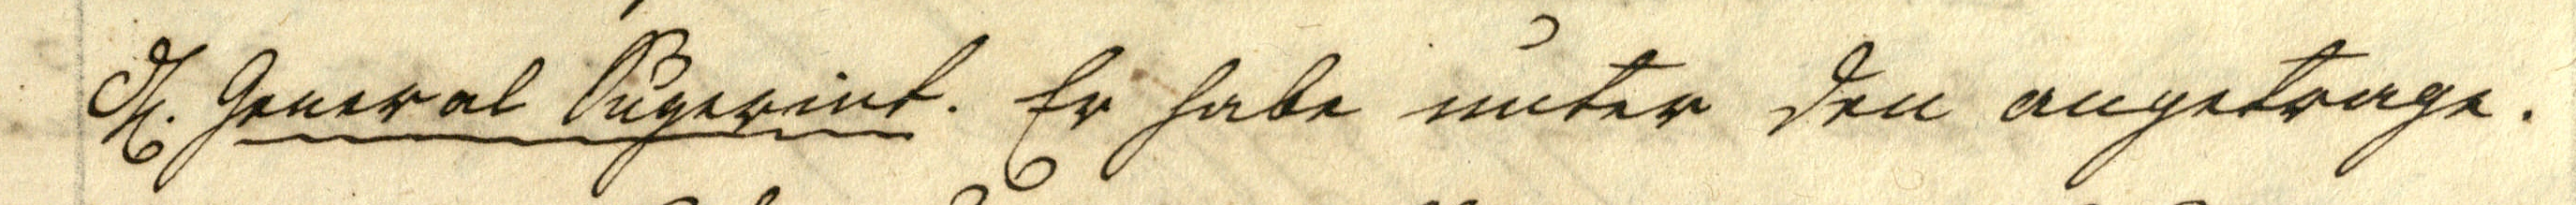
dh. General Superint. Er habe unter den angetrage-
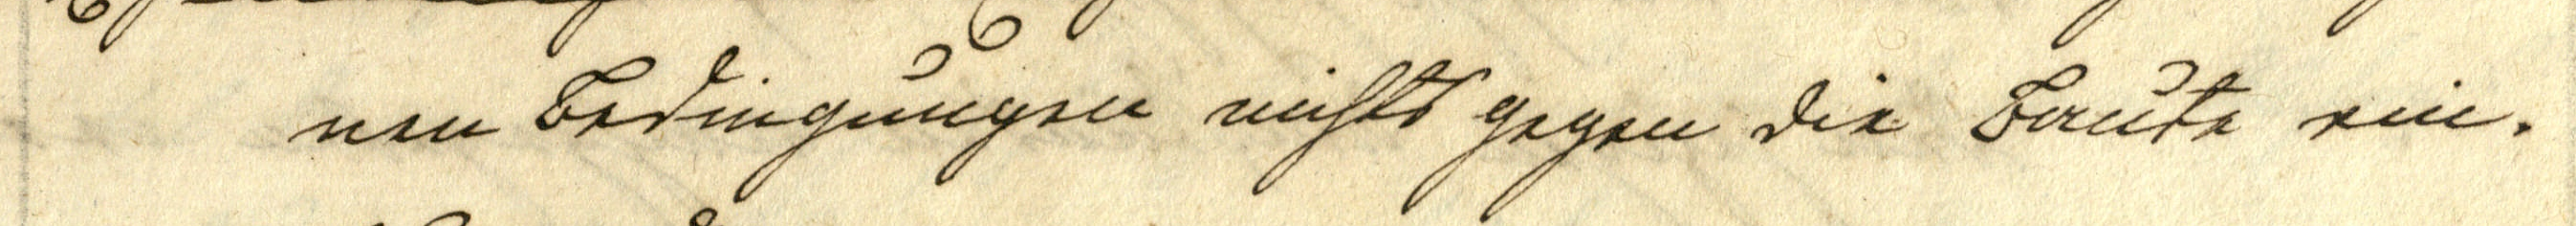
nen Bedingungen nichts gegen die Baute ein-
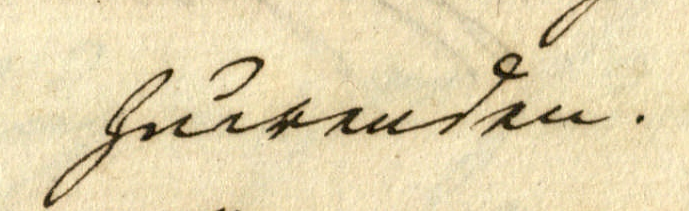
zuwenden
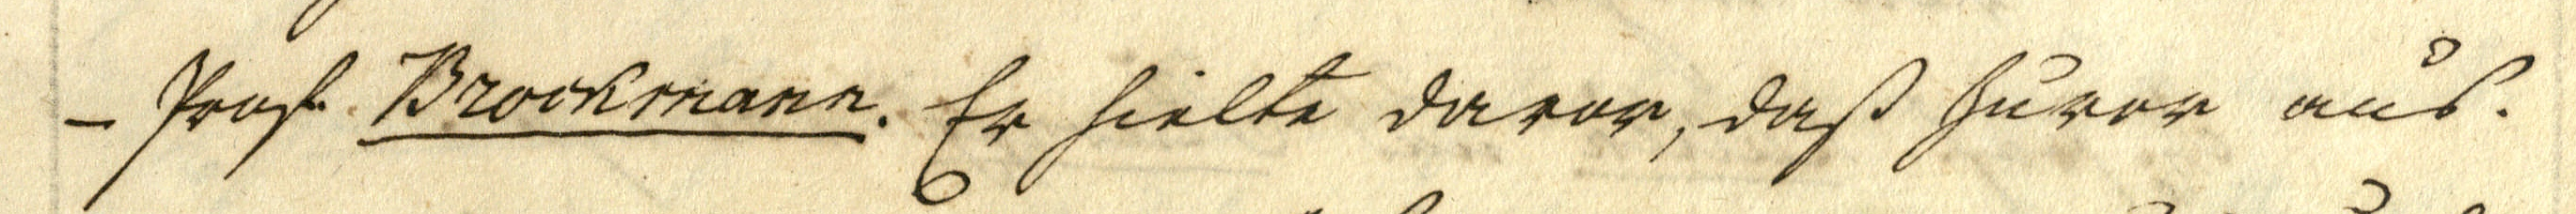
- Prof. Brockmann. Er hielte davor, daß zuvor aus-
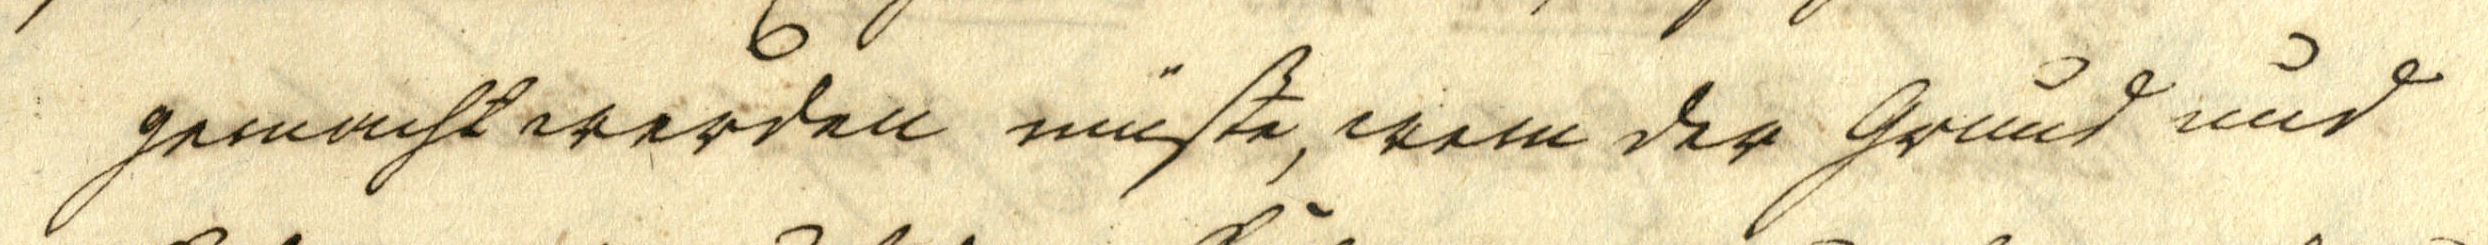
gemacht werden müßte, wem der Grund und
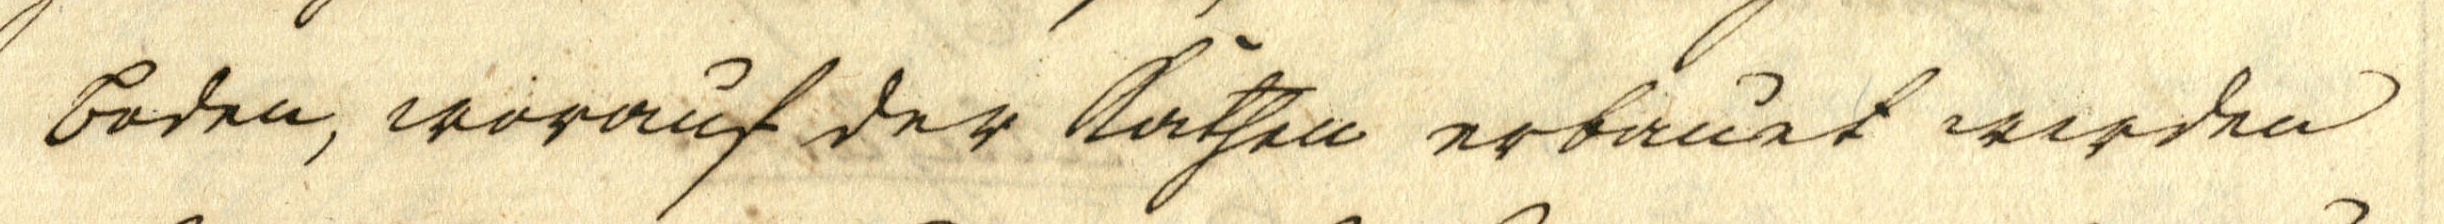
Boden, worauf der Kathen erbauet werden
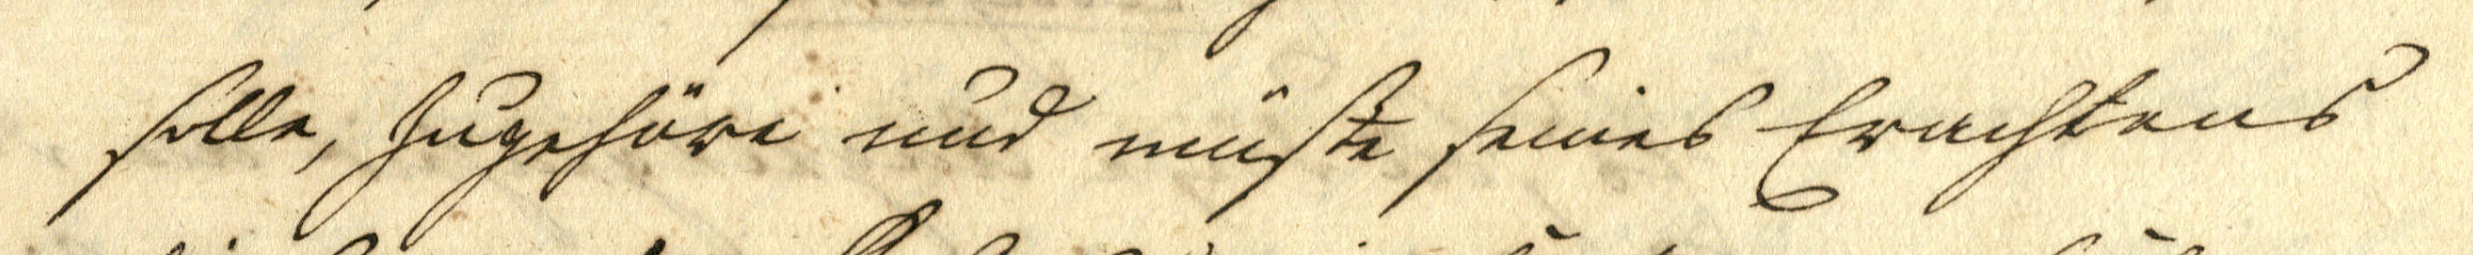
solle, zugehöre und müßte seines Erachtens
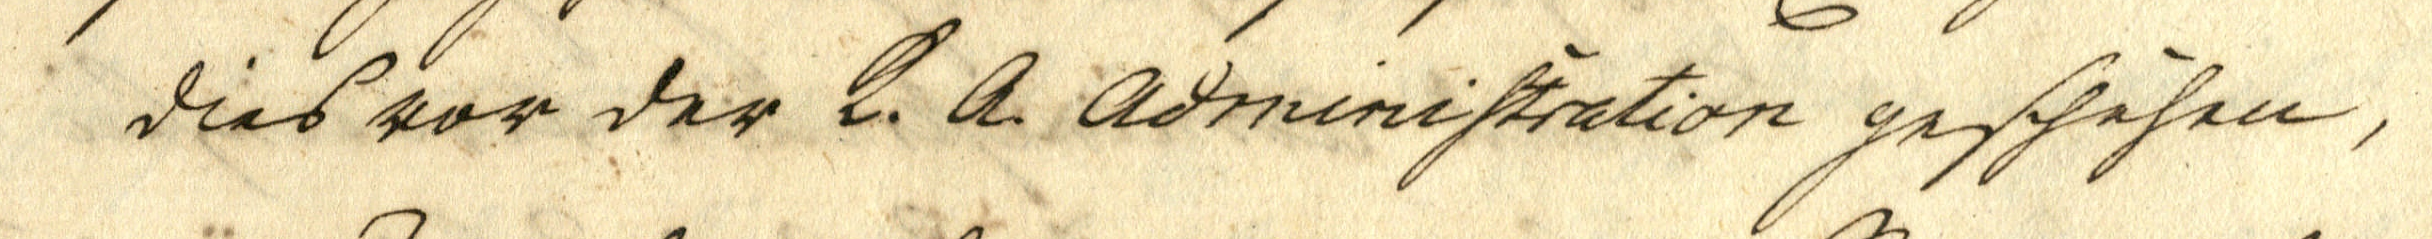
dies vor der K. A. Administration geschehen,
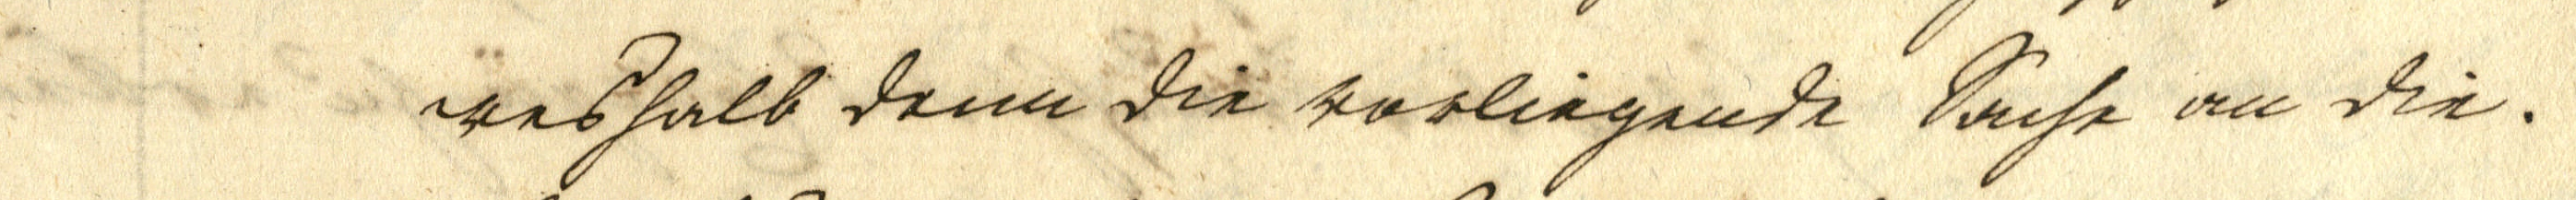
weshalb denn die vorliegende Sache an die-
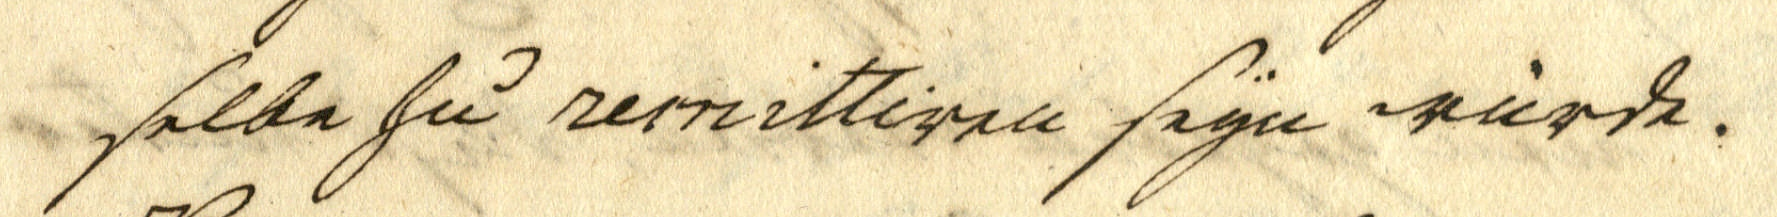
selbe zu remittiren seyn würde.
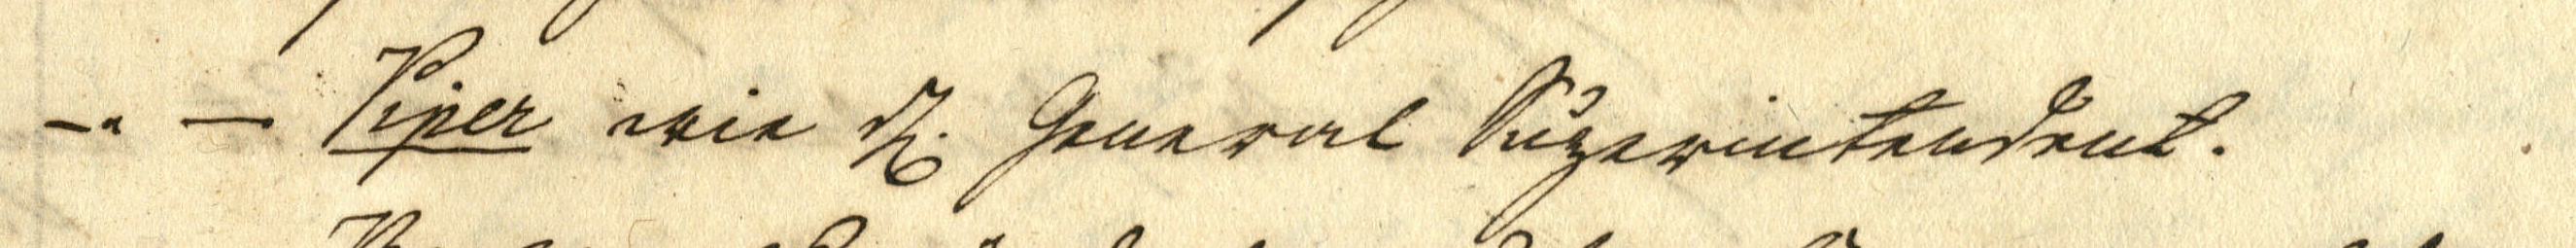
- " - Piper wie dh. General Superintendent.
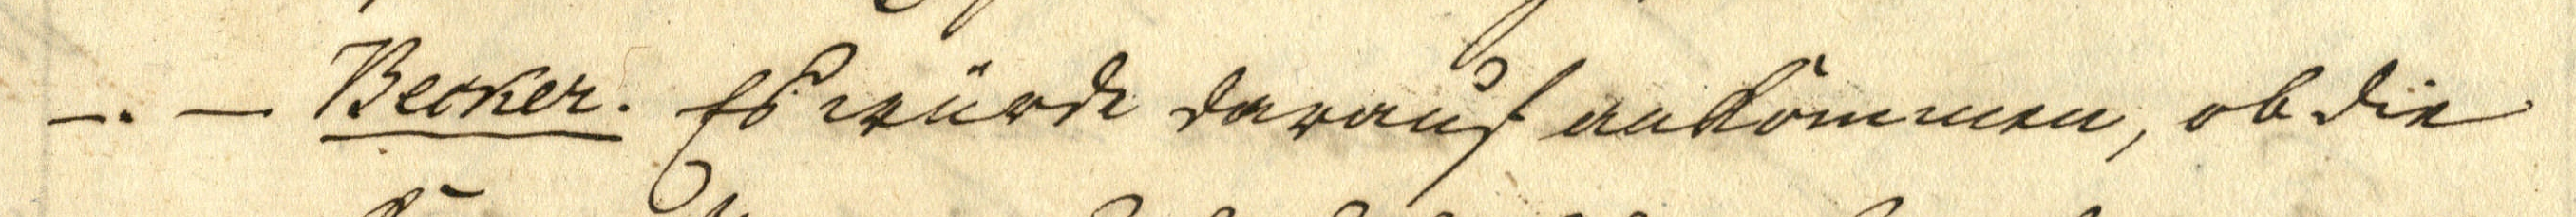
- " - Becker. Es würde darauf ankommen, ob die
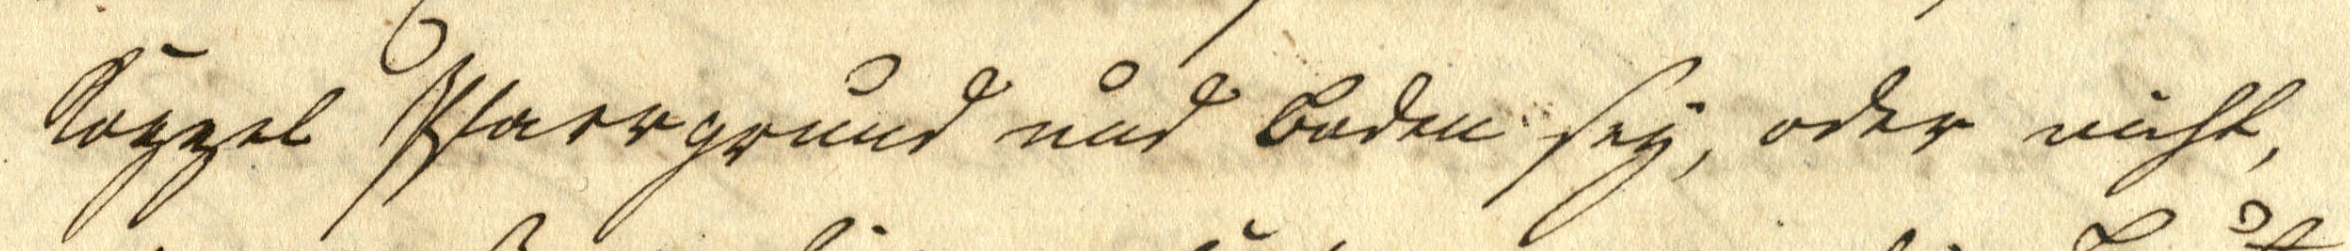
Koppel Pfarrgrund und Boden sey, oder nicht,
